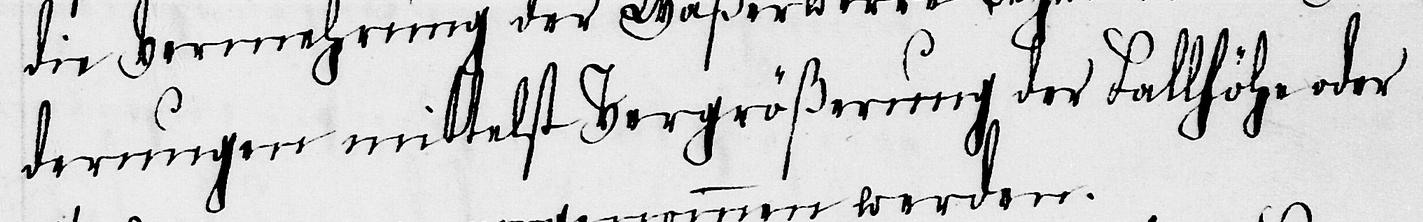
derungen mittelst Vergrößerung der Fallhöhe oder
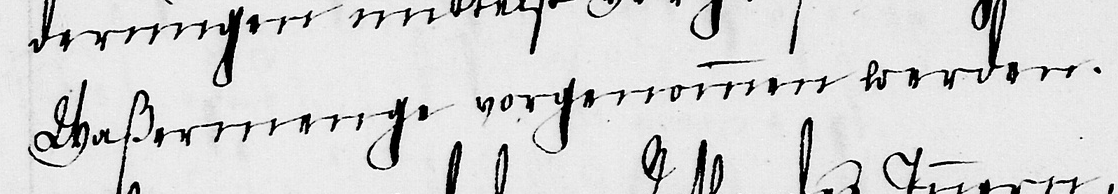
Waßermenge vorgenommen werden.
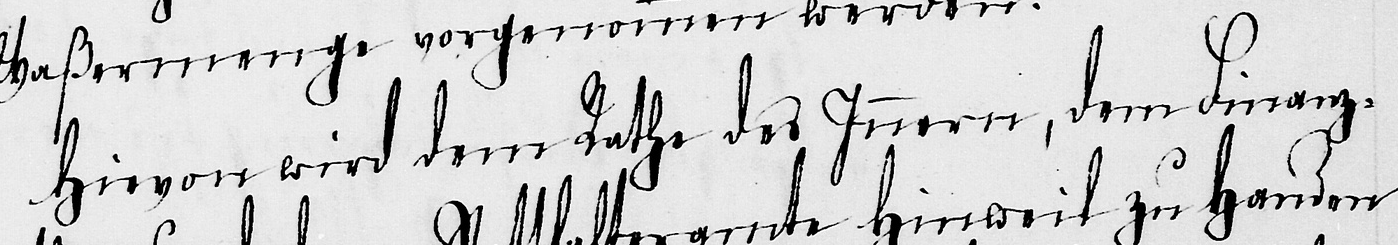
Hievon wird dem Rathe des Innern, dem Finanz¬
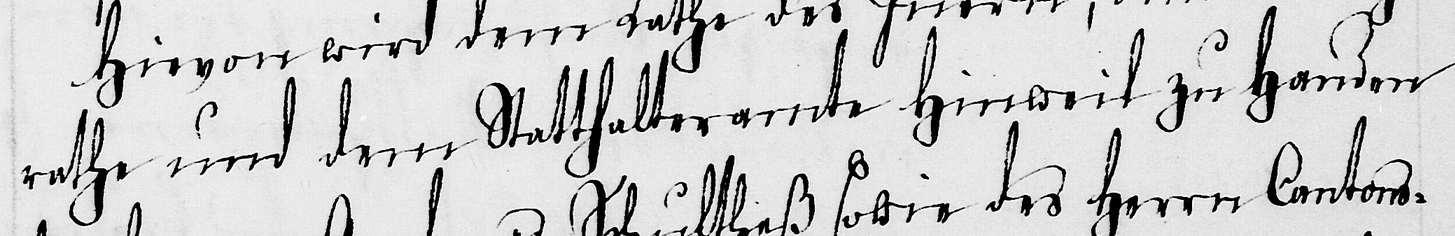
rathe und dem Statthalteramte Hinweil zu Handen
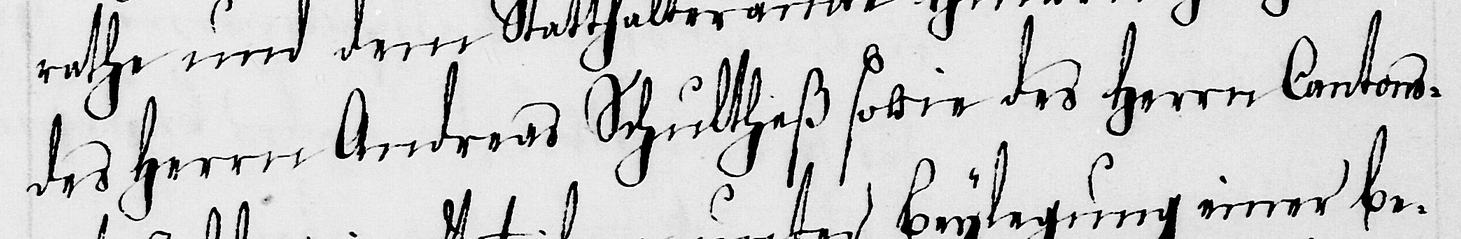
des Herrn Andreas Schultheß sowie des Herrn Cantons¬
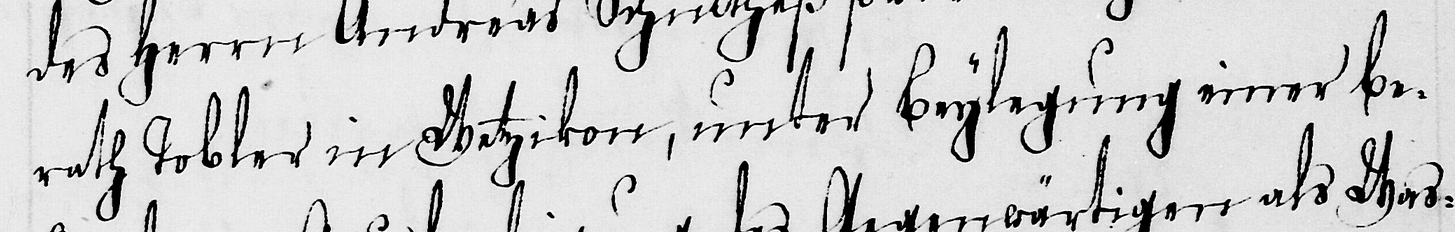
rath Tobler in Wetzikon, unter Beylegung einer be¬
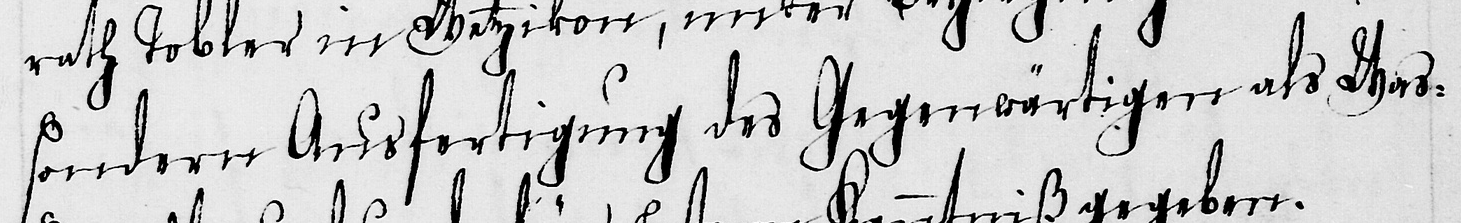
sondern Ausfertigung des Gegenwärtigen als Was¬
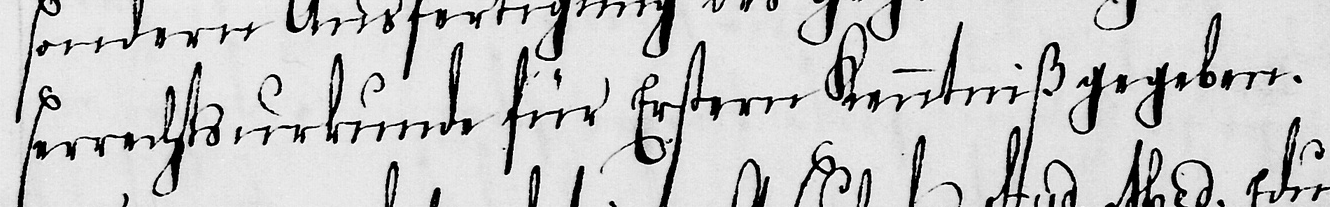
serrechtsurkunde für Erstern Kenntniß gegeben.
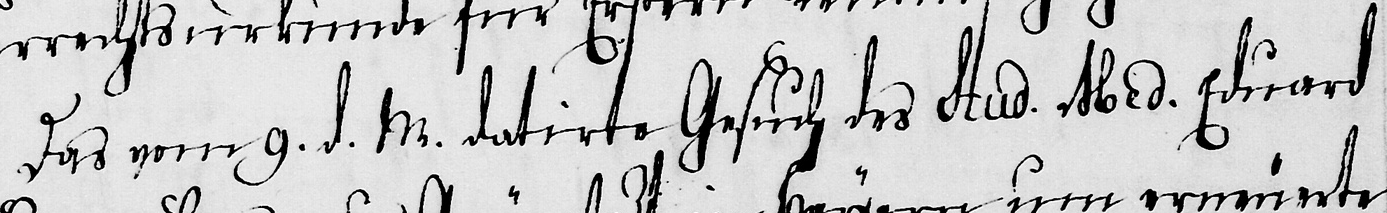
Das vom 9. d. M. datirte Gesuch des Stud. Med. Eduard
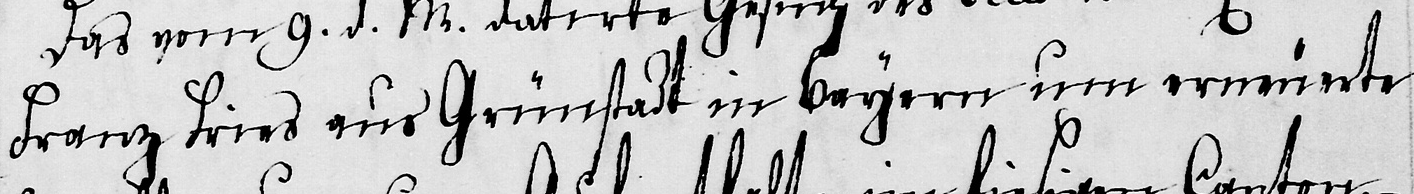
Franz Fries aus Grünstadt in Bayern um erneuerte
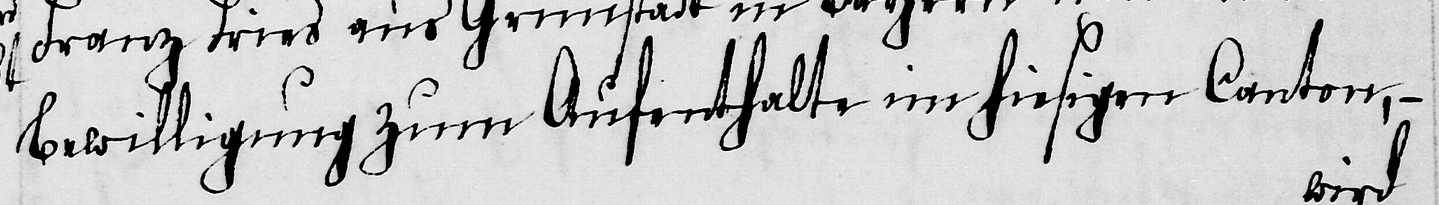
Bewilligung zum Aufenthalte im hiesigen Canton,
